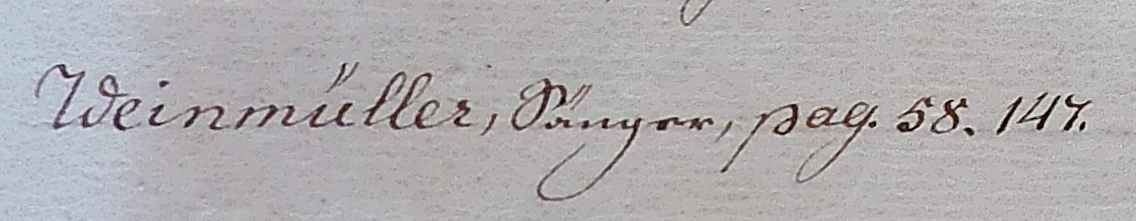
Weinmüller, Sänger, pag. 58. 147.
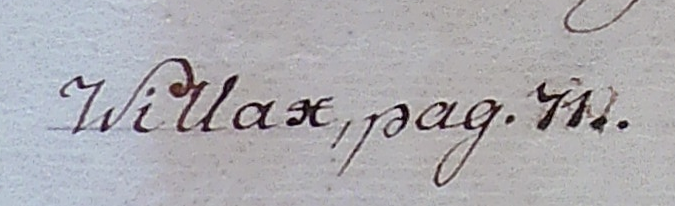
Willax, pag. 71.
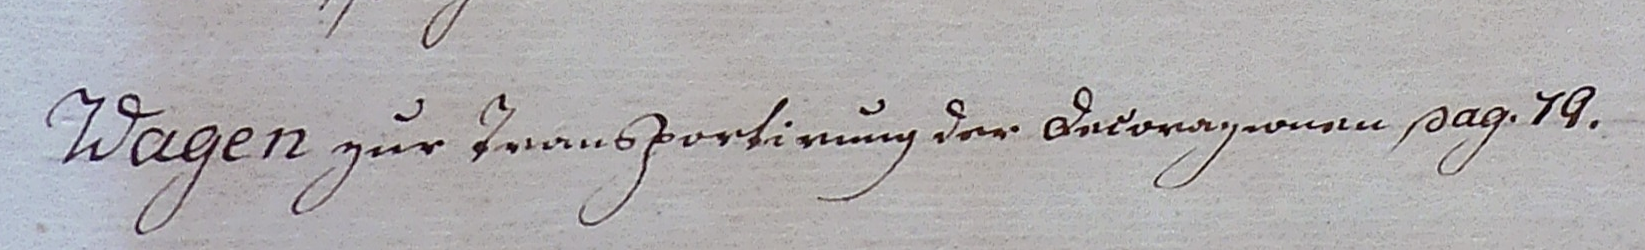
Wagen zur Transportirung der Decorazionen pag. 79.
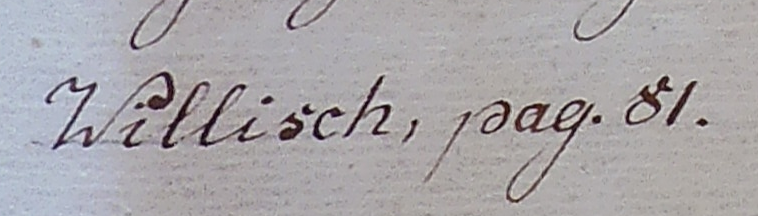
Willisch, pag. 81.
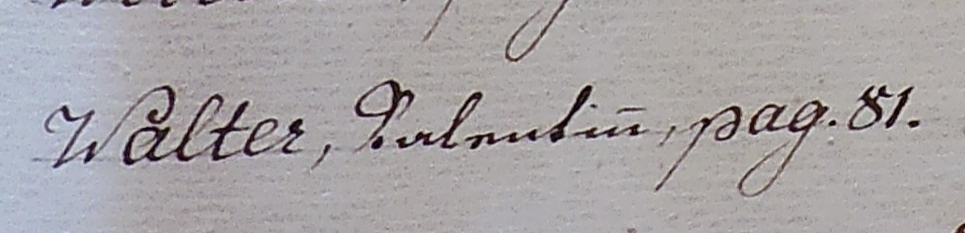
Walter, Valentin̅, pag. 81.
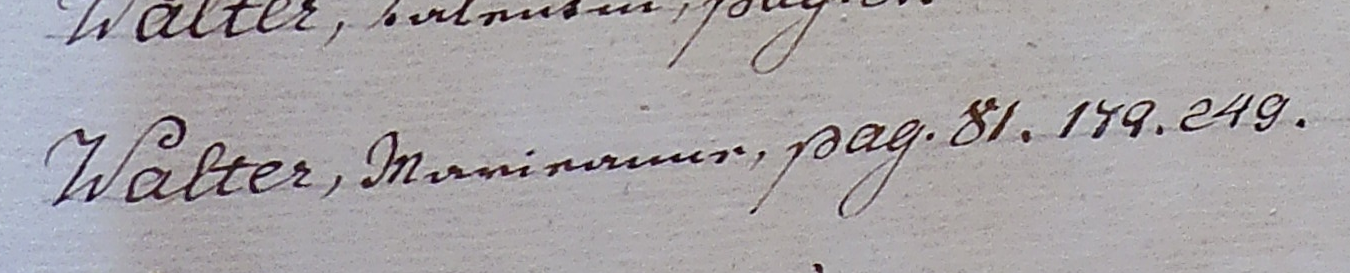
Walter, Marieanne, pag. 81. 179. 249.
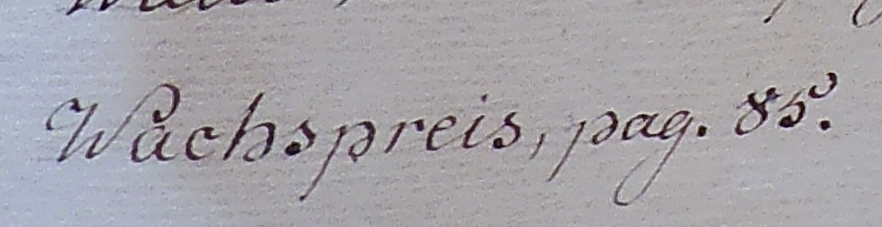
Wachspreis, pag. 85.
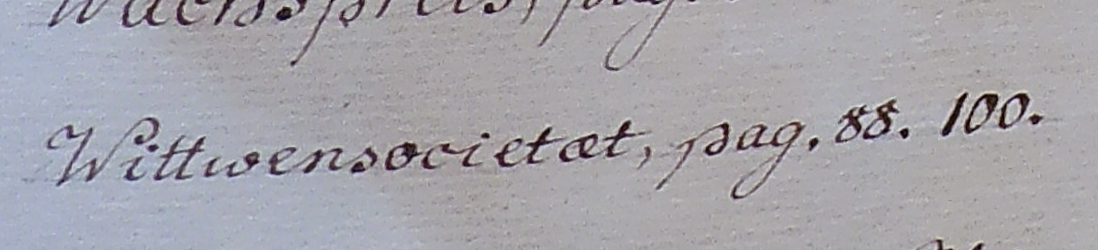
Wittwensocietæt, pag. 88. 100.
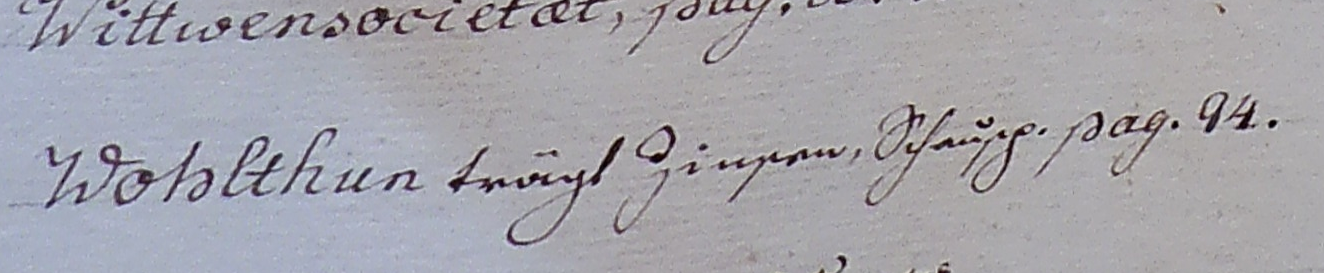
Wohlthun trägt Zinsen, Schausp. pag. 94.
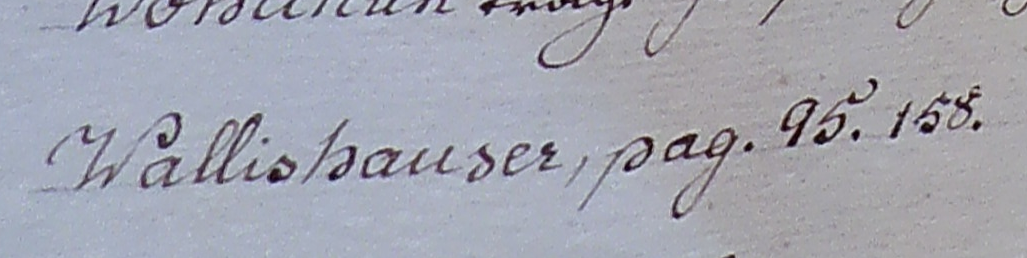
Wallishauser, pag 95. 158.
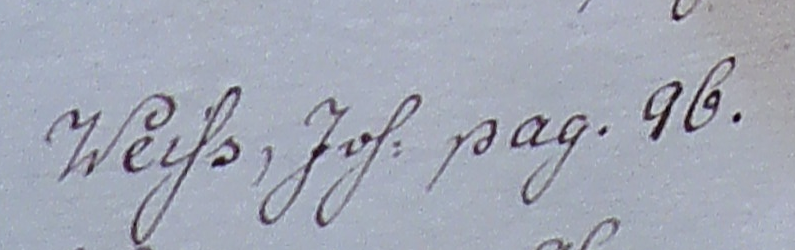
Weihs, Joh: pag. 96.
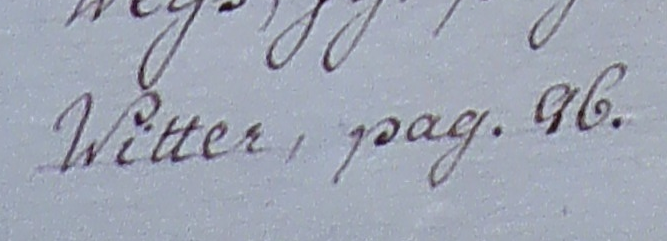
Witter, pag. 96.
